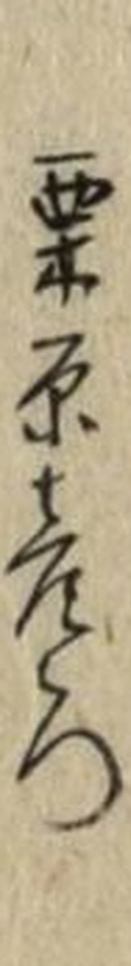栗原彦右衛門
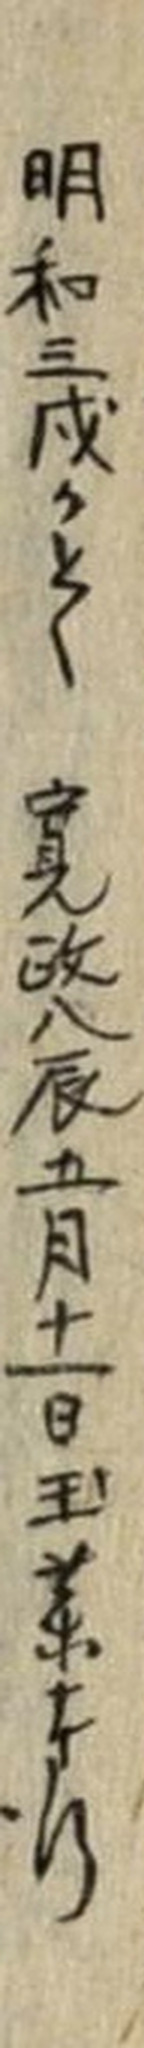明和三戌之かとく寛政八辰五月十一日玉薬奉行
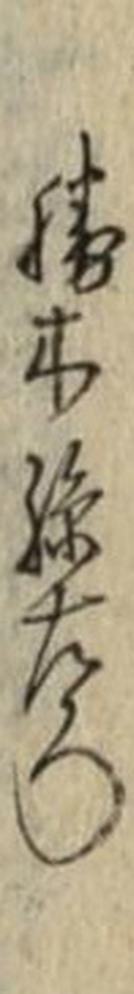勝木孫左衛門
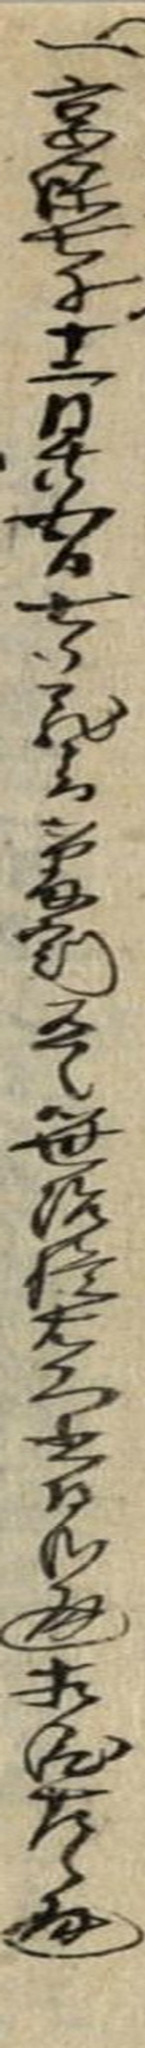一享保七寅十二月廿五日七ッ蔵二而御番割有之笹治権右衛門書付弐通相渡左之通
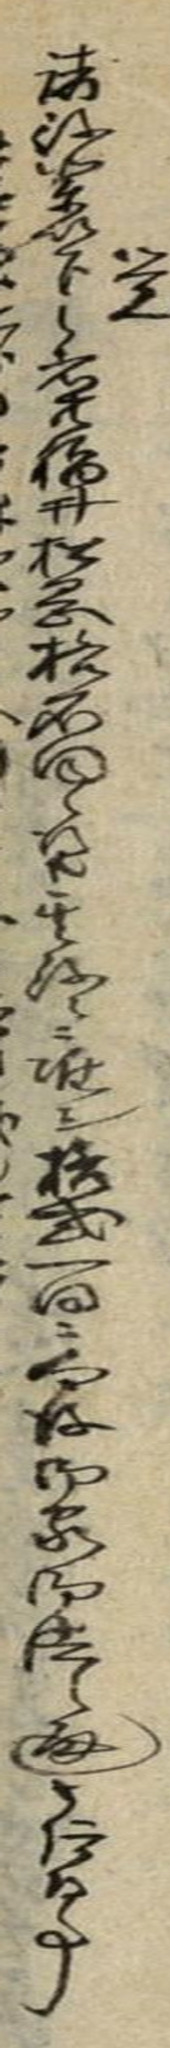諸役輩以下之者共福井松岡格不同候得共其役々に准し格式一同に向後御家御法之通被仰付事
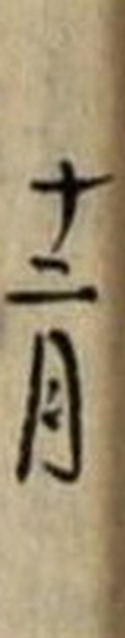十二月
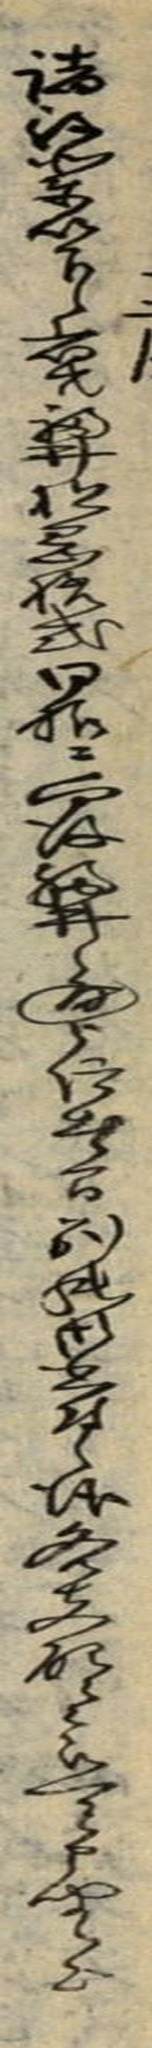諸役輩以下之者共福井松岡格式同様に向後福井之通被仰出候間別紙御書付之趣各支配へ被下？可被申聞候以上
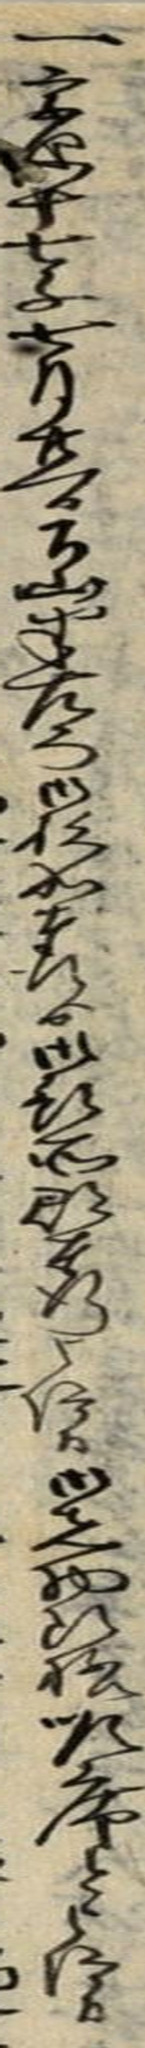一享保十七子七月廿一日下山半左衛門御杉成奉行ゟ御預所郡奉行被仰付御先物頭格順席と被仰付
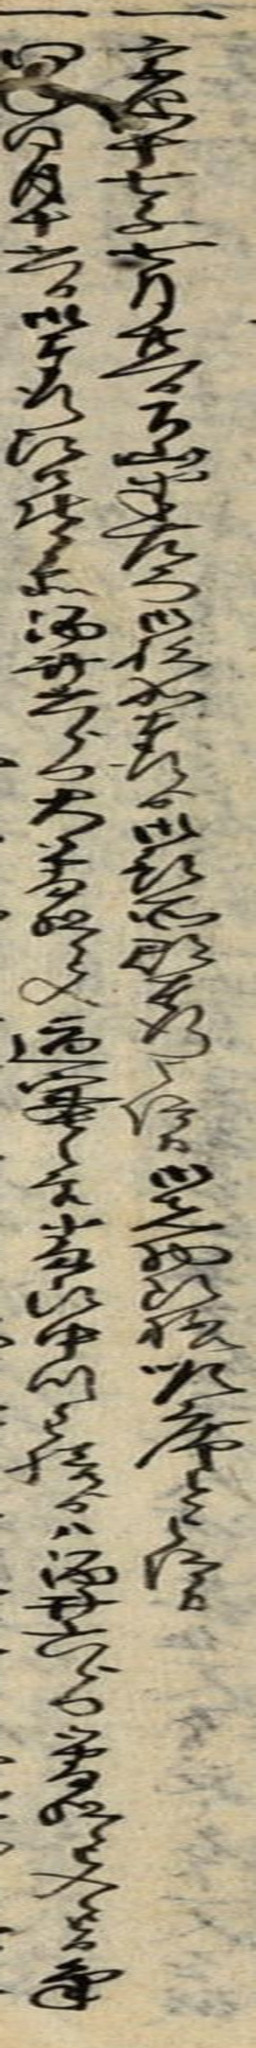一同年同月十六日御奉行江口次郎兵衛酒井六郎右衛門大御番組へ被入逼塞之節番頭中川主膳ゟは酒井六郎右衛門御番組へ被入候旨筆
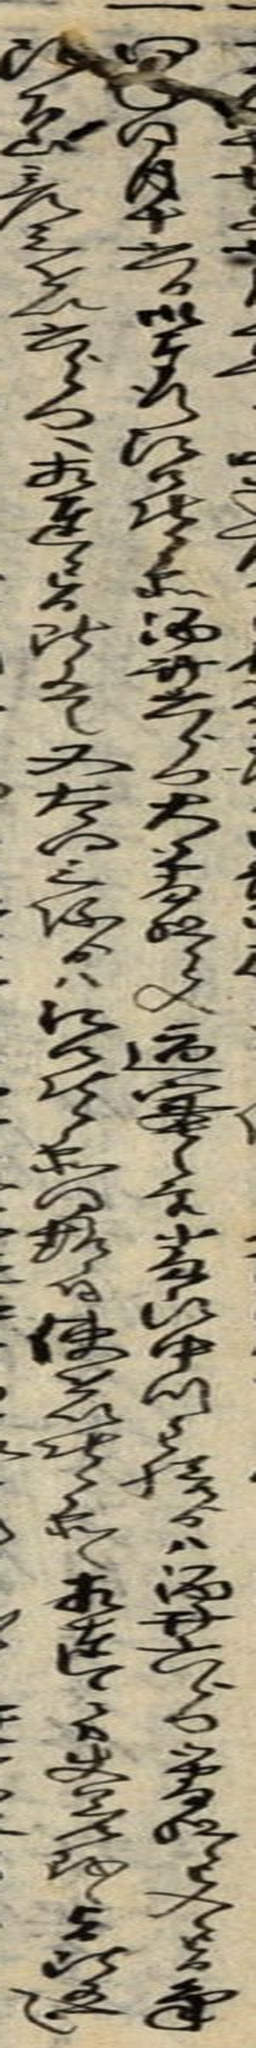頭下山彦三を以六郎右衛門へ相達候旨断有之又太田三弥ゟは江口次郎兵衛同趣に付使を以次郎兵衛へ相達候に付使差越候旨断有之
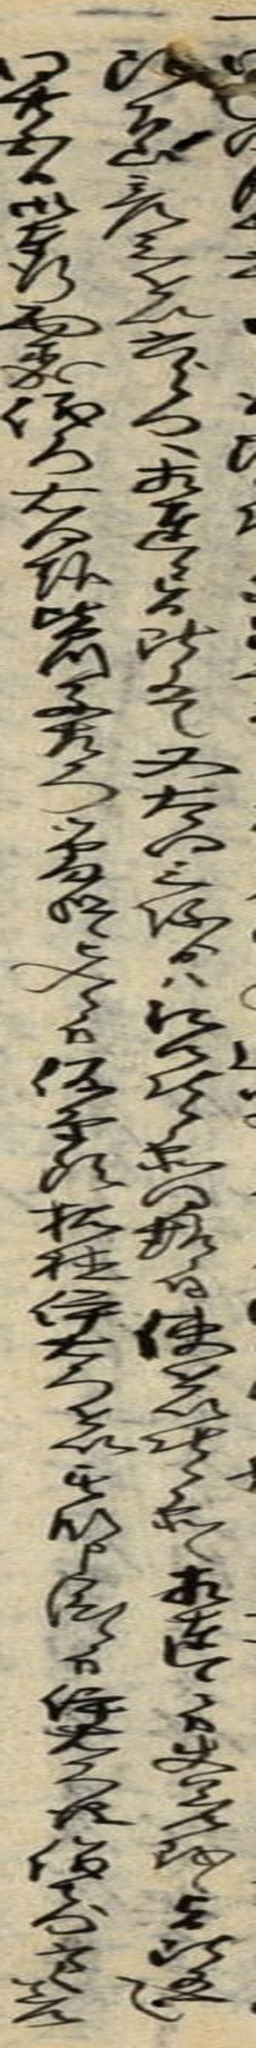同廿五日御奉行雨森儀右衛門右同趣皆川多左衛門御番組へ被入候に付役筆頭柘植伊右衛門を以其段申渡候に付伊右衛門儀儀右衛門方へ差
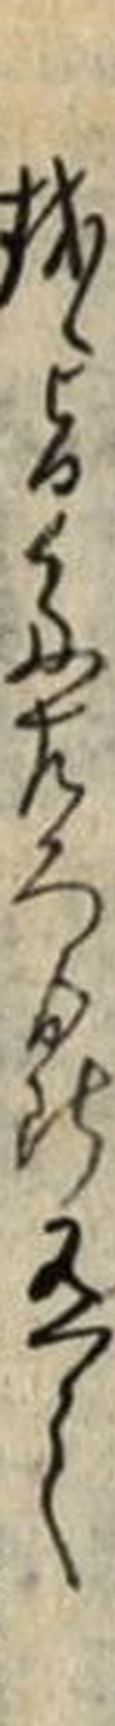越候旨多左衛門ゟ断有之
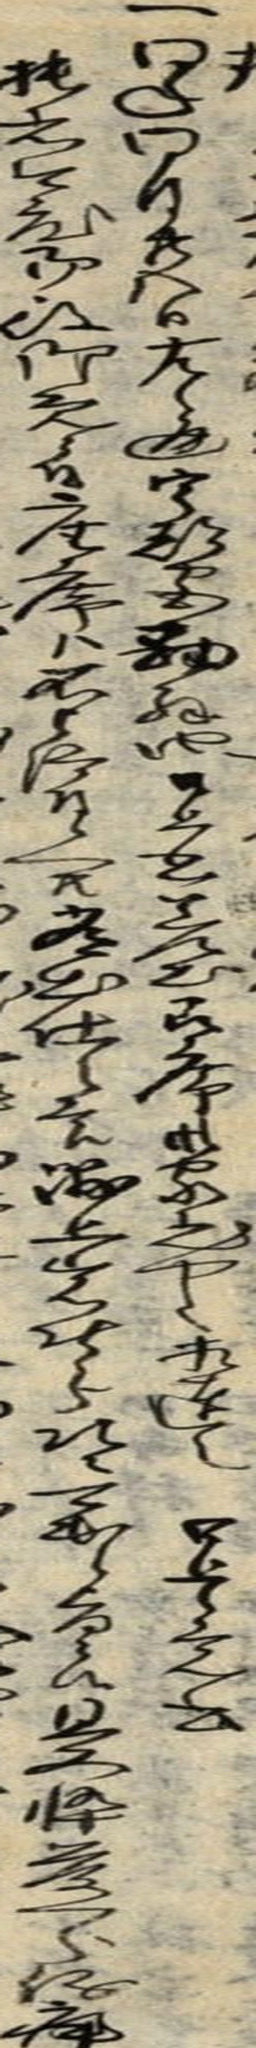拙者今度御役御免に付座席は不被仰付候へ共常出仕候節浦上岩次郎次へ可出候旨に候且又忰藤一郎儀痛
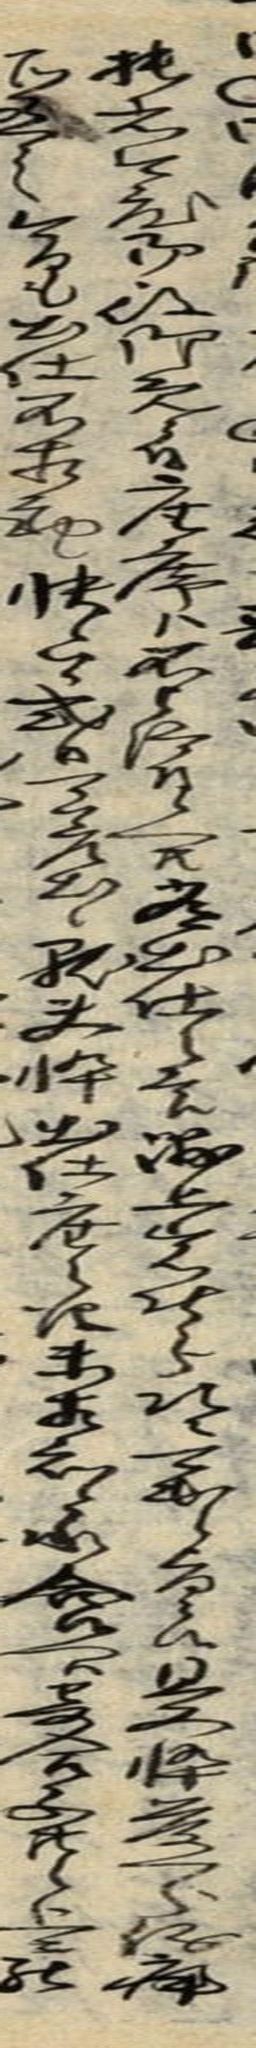所有之今日も出仕不相勤候快候はゝ式日可差出候就夫忰出仕座之儀未相知承合候へは寄合子共之上に罷
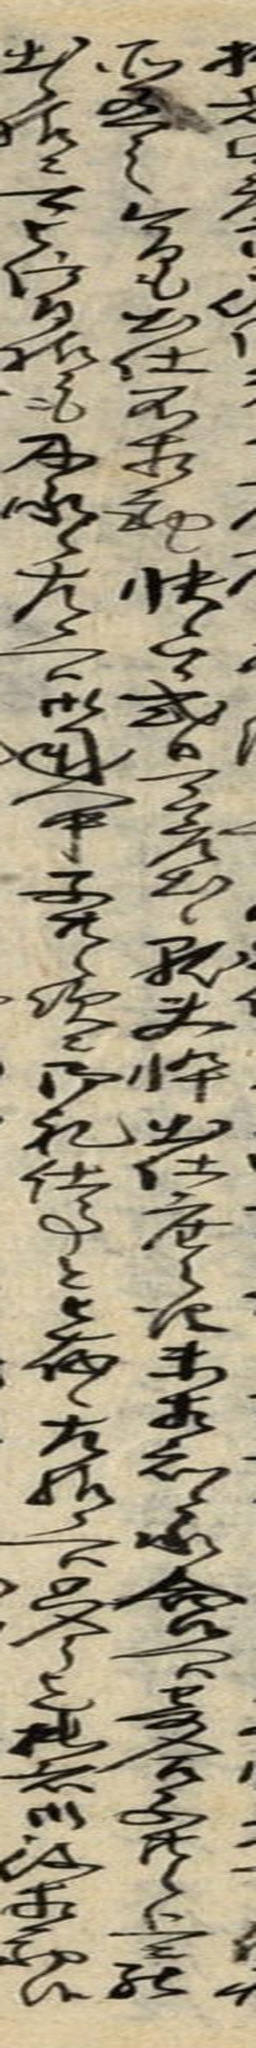出候様に可被仰付候様にも及承候左候へは御用人中子共之次に御礼仕候事と被存候左様候へは只今迄拙者御役相勤候
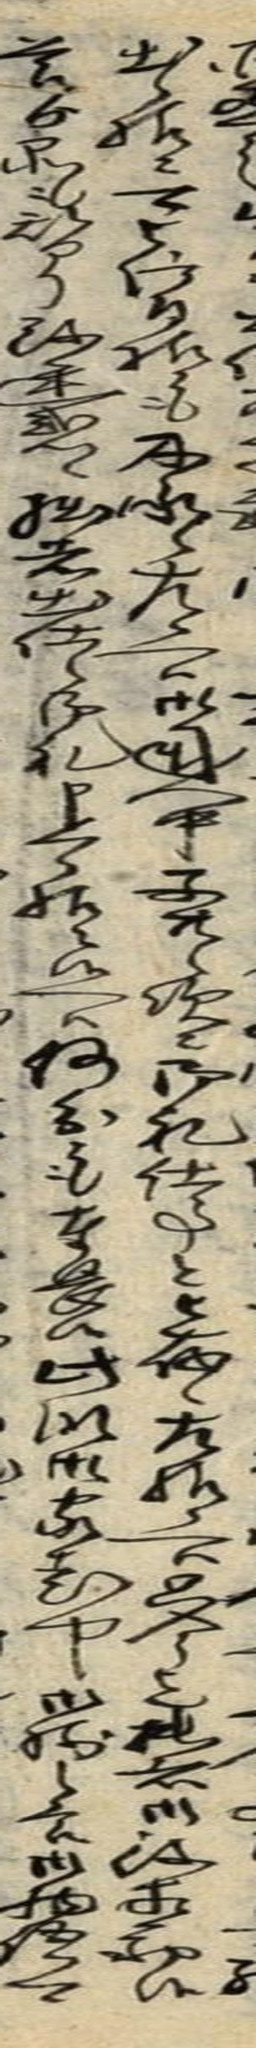節ゟ品も替り致迷惑候拙者出仕之御礼申上候様に候へは何分にも奉畏候此段御家老中御揃之節御物語可
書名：御用并被仰出之部
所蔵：福井県文書館 Fukui Prefectural Archives
